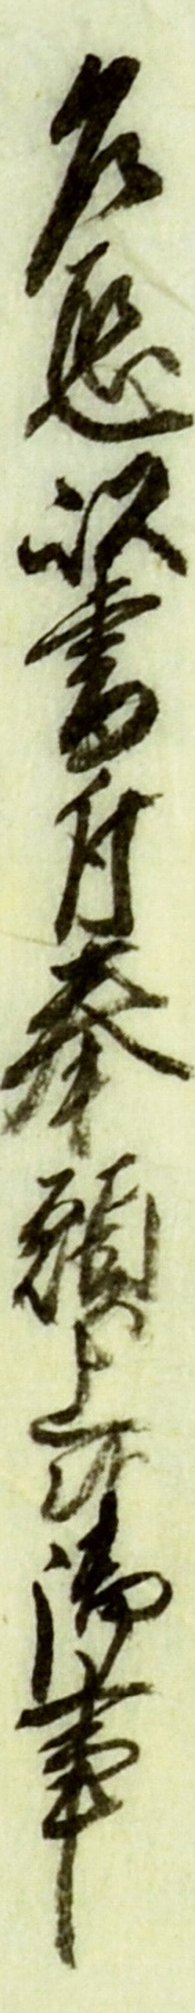乍恐以書付奉願上候御事
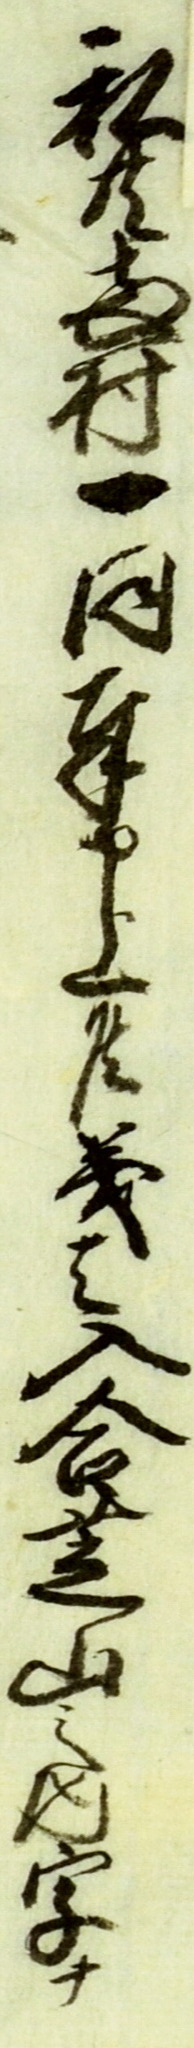私共両村一同奉申上候義者入合芝山之内字ヲ
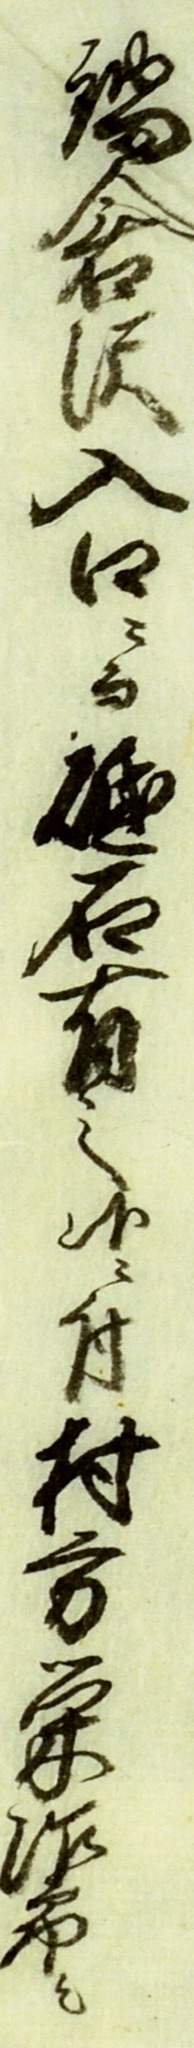鍋倉沢入口ニ而砥石有之候ニ付村方栄治郎与
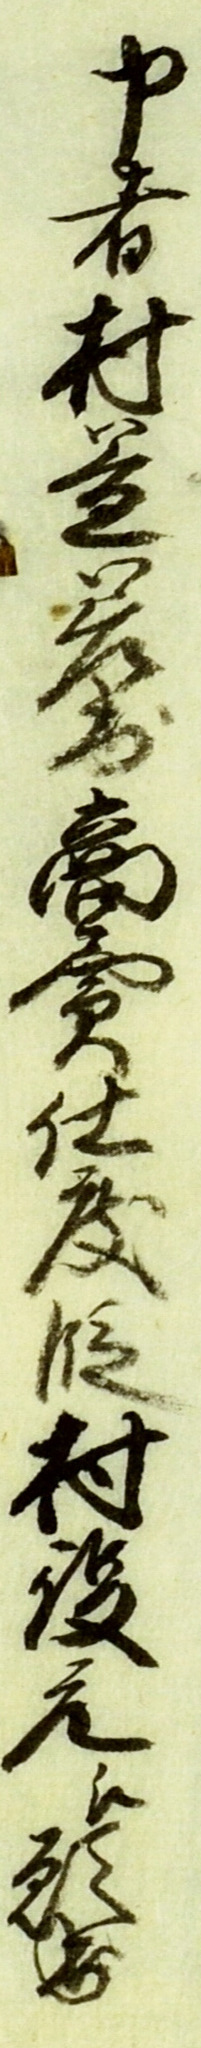申者村益差出商売仕度段村役元江願出
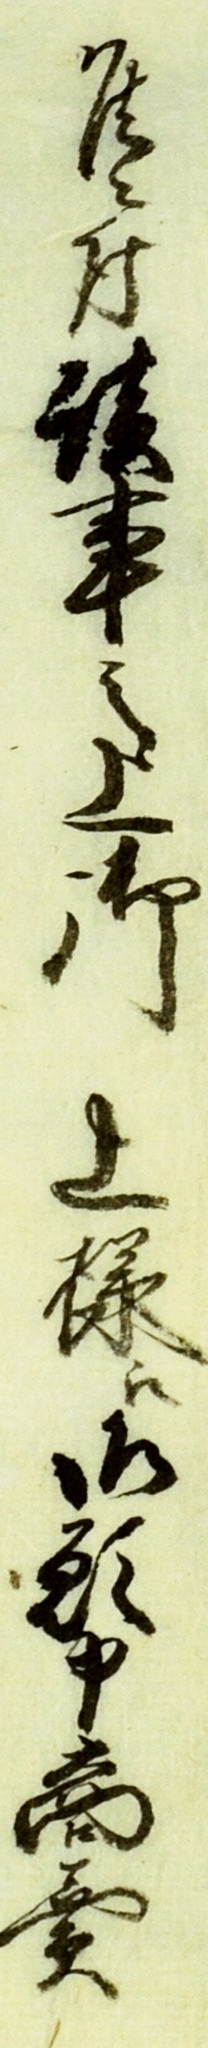候ニ付談事之上御上様江御願申商売
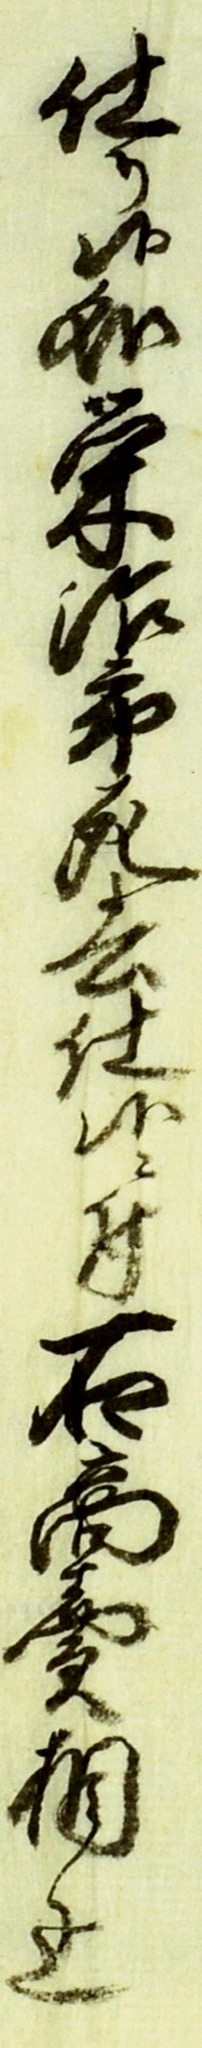仕り候処栄治郎死去仕候ニ付石商売相止
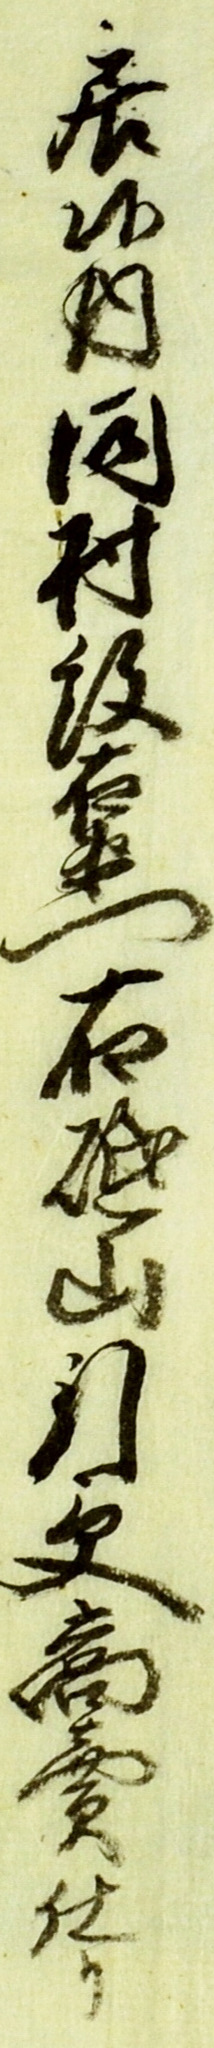居候内同村紋右衛門右砥山引受商売仕り
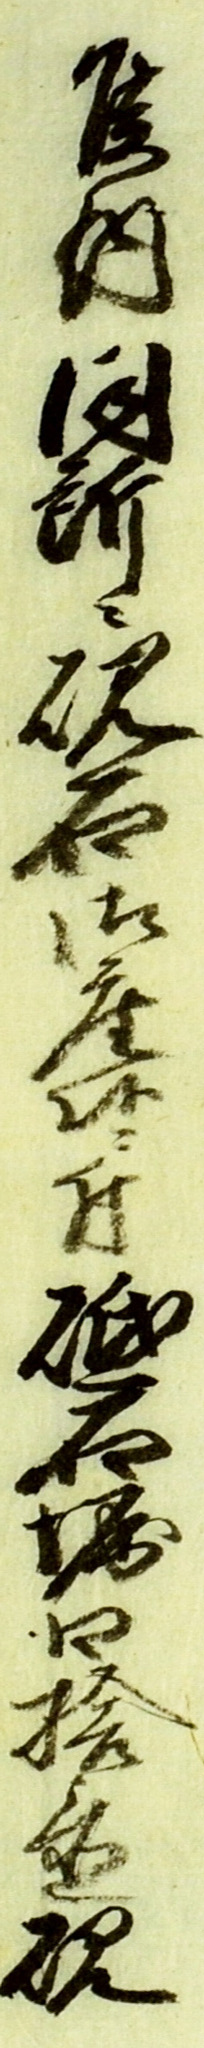候内同所ニ硯石御座候ニ付砥石堀口捨置硯
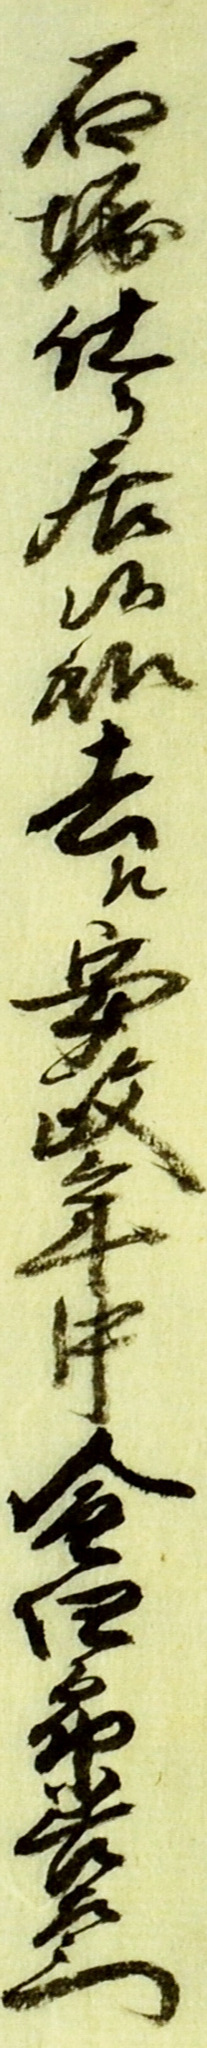石堀仕り居候処去ル安政年中金四郎善左衛門
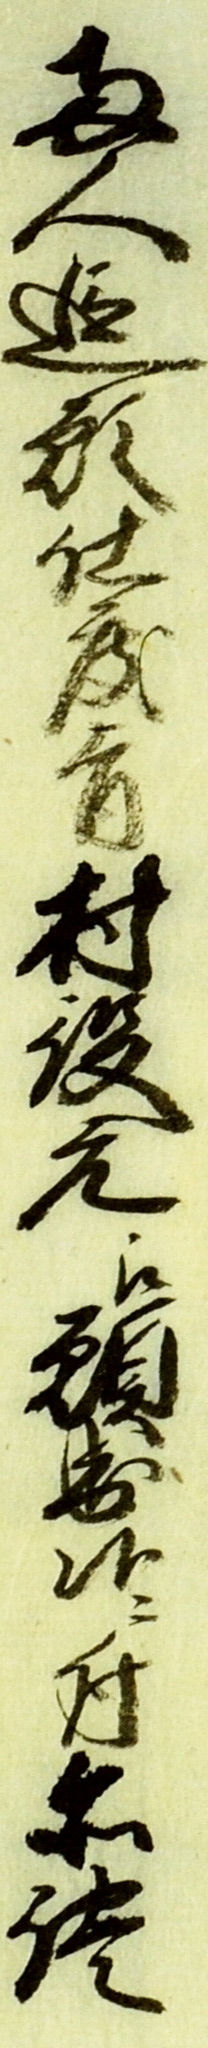両人追願仕度旨村役元江願出候ニ付示談
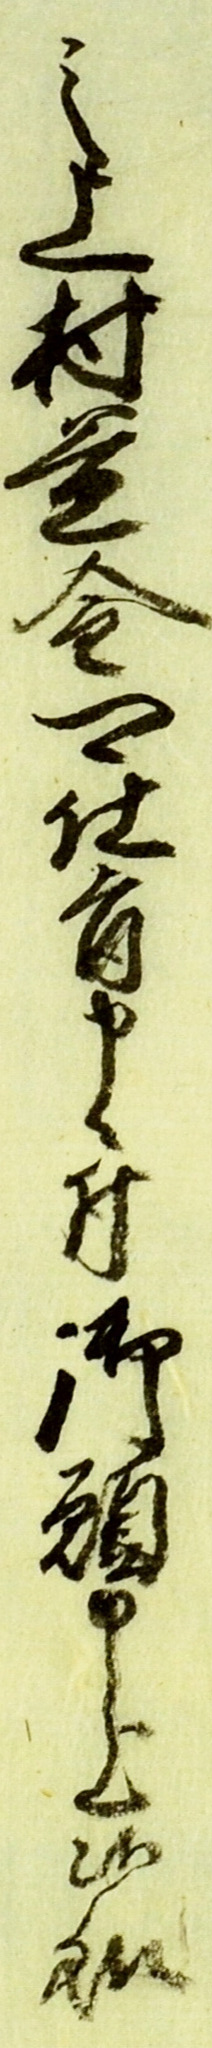之上村益金可仕旨申ニ付御願申上候処
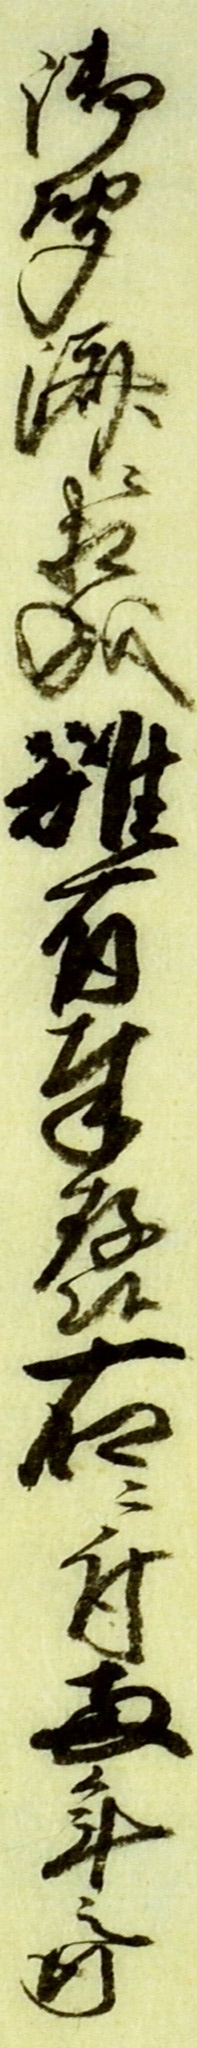御聞済ニ相成難有奉存候右ニ付両年之内
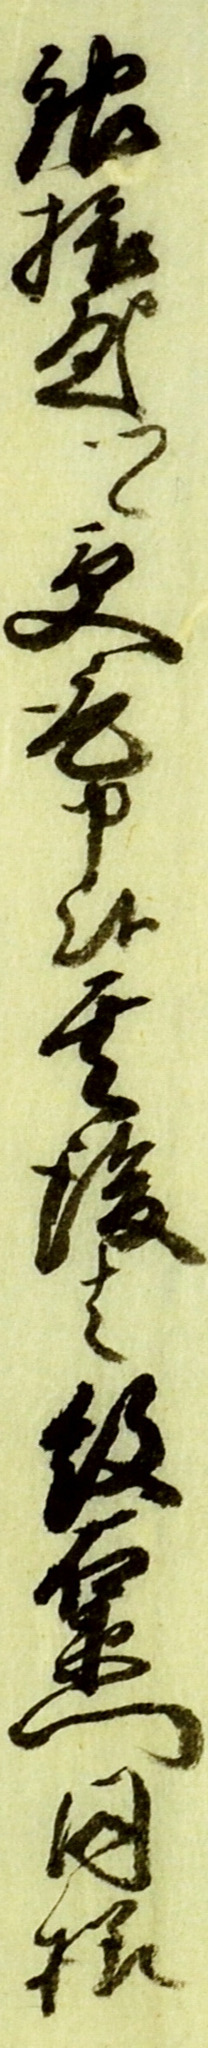銀拾両ツゝ受取申候其後者紋右衛門同様
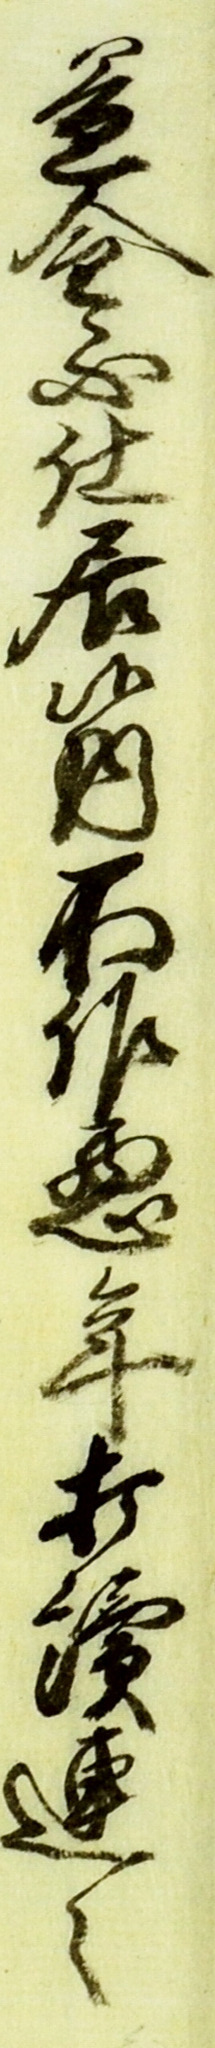懸金不仕居候内不作悪年打続連々
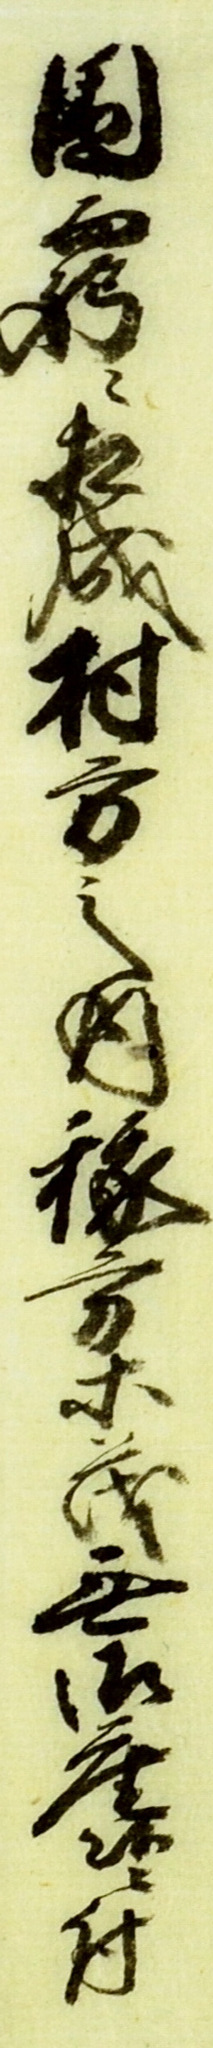困窮ニ相成村方之内稼方等茂無御座候ニ付
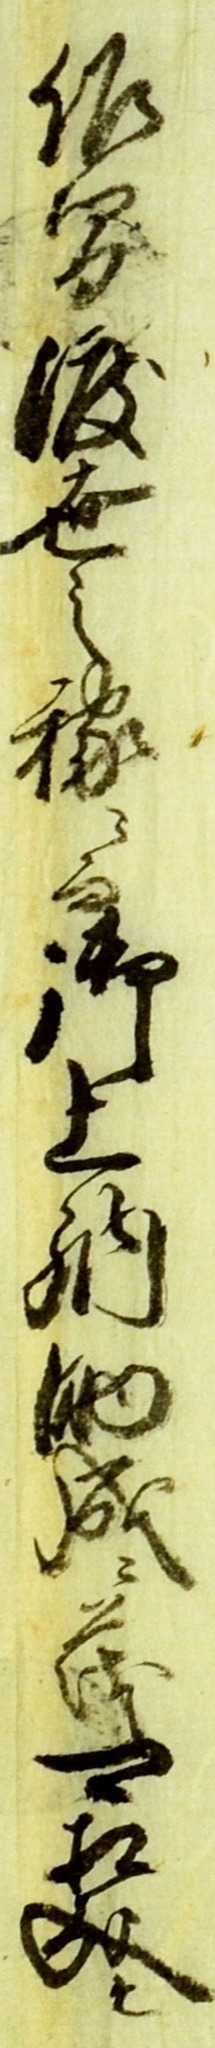作間渡世之稼ニ而御上納成ニ茂可相成与
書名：乍恐以書付奉願上候御事
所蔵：伊那市立高遠町図書館・合同会社AMANE
